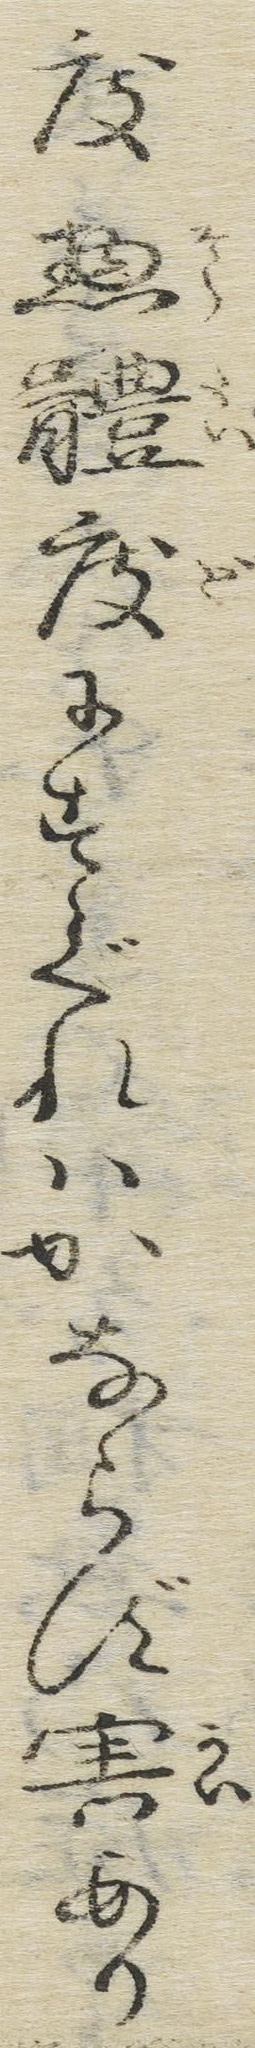度惣体度にすぐれはかならず害あり
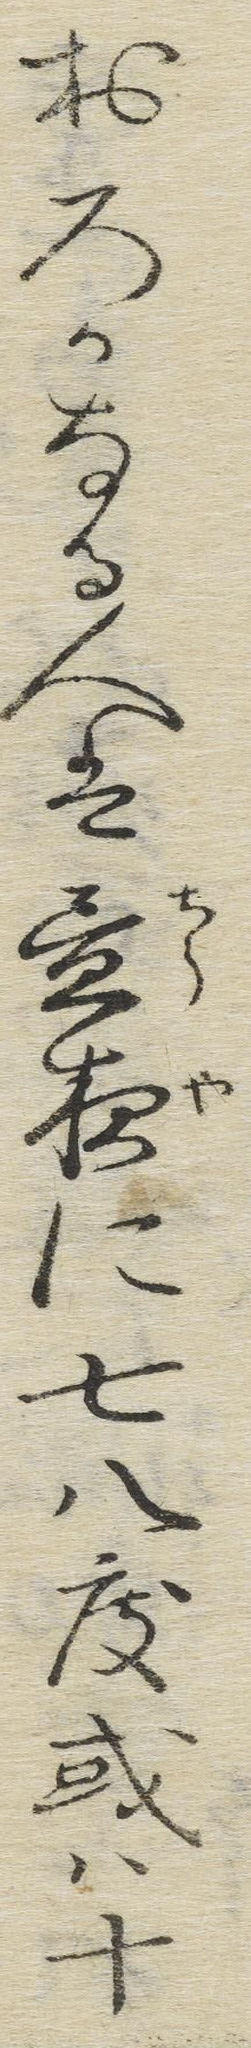おろかなる人は昼夜に七八度或は十
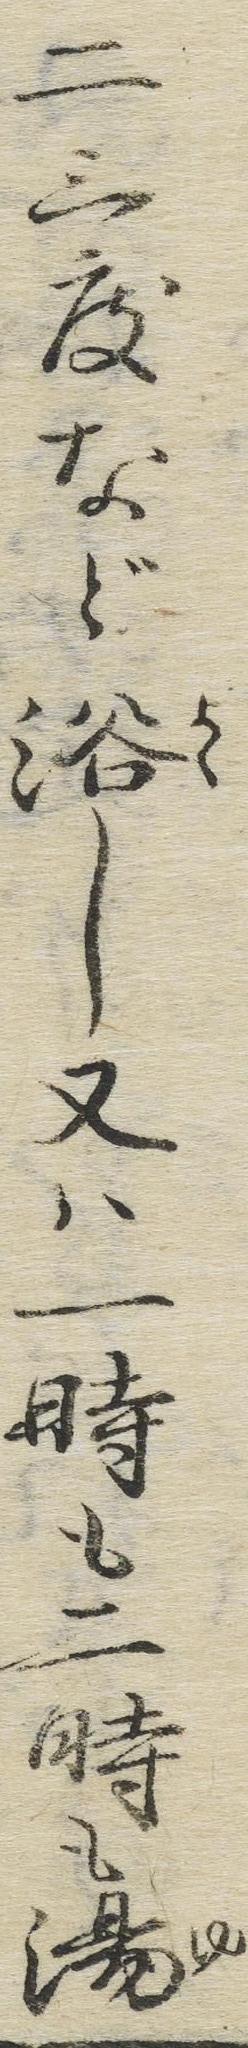二三度など浴し又は一時も二時も湯
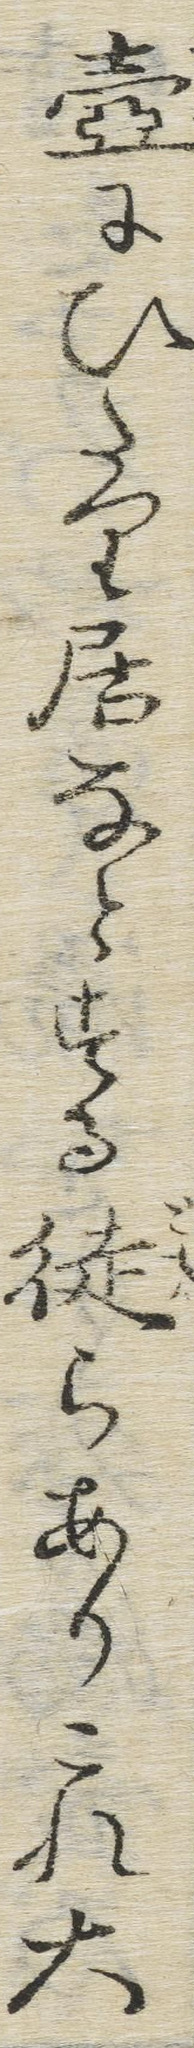壺にひたり居なとする徒らありこれ大
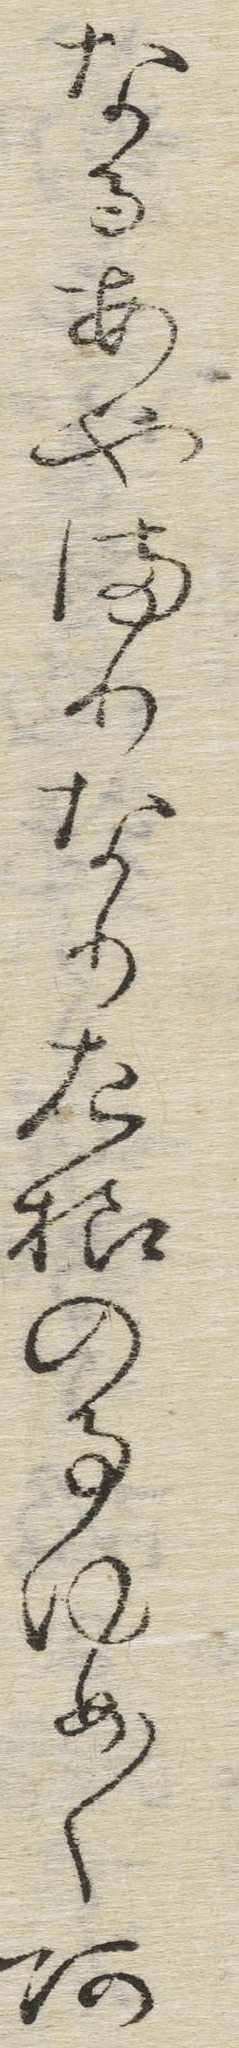なるあやまりなり左様の事ゆめ〳〵あ
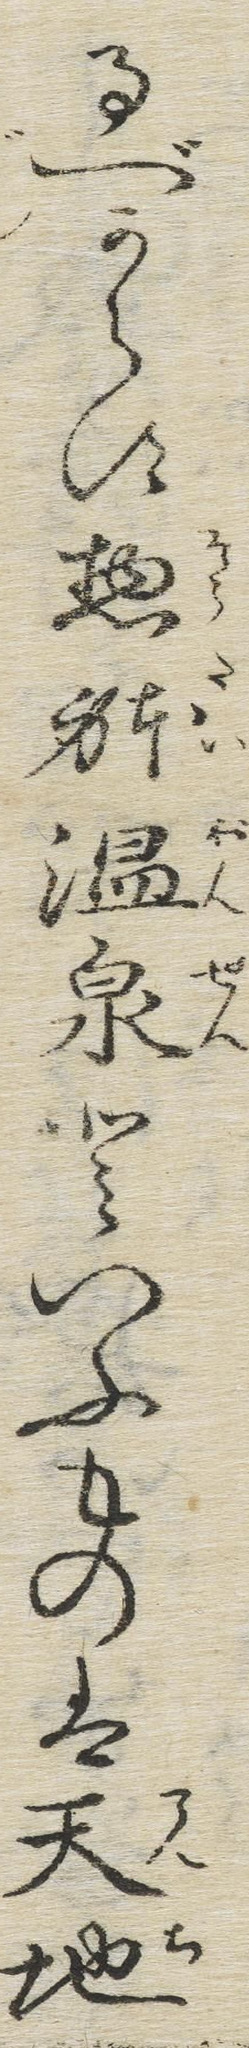るべからす惣体温泉といふものは天地
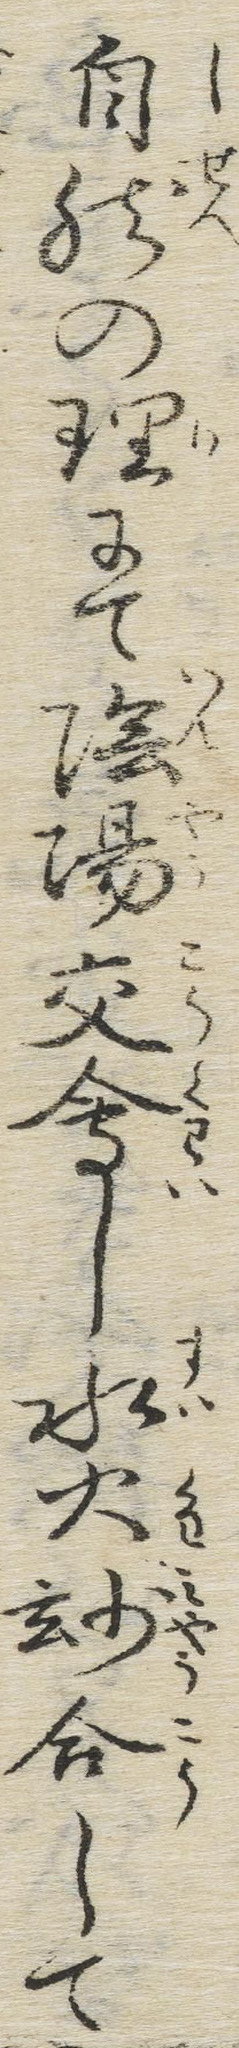自然の理にて陰陽交会し水火玅合して
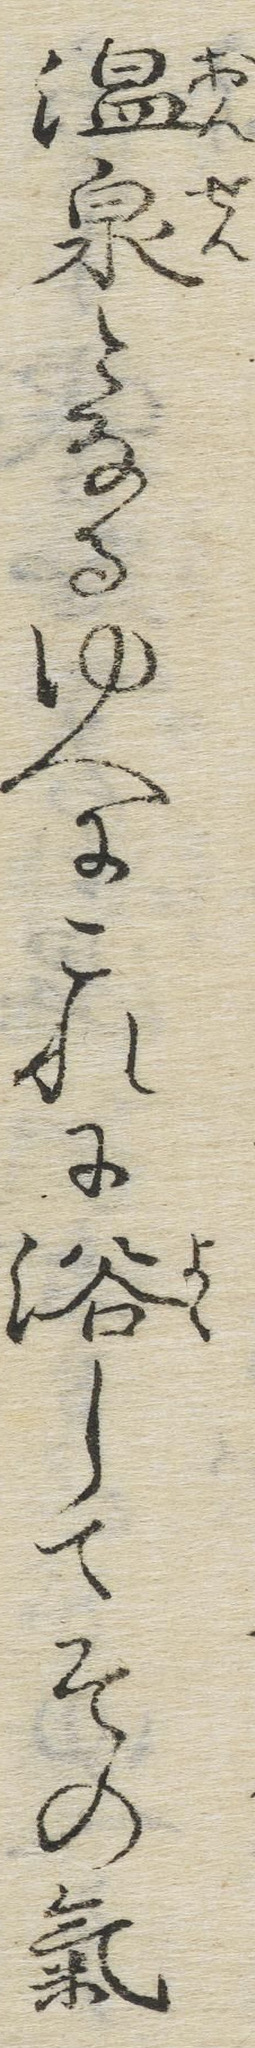温泉となるゆへにこれに浴してその気
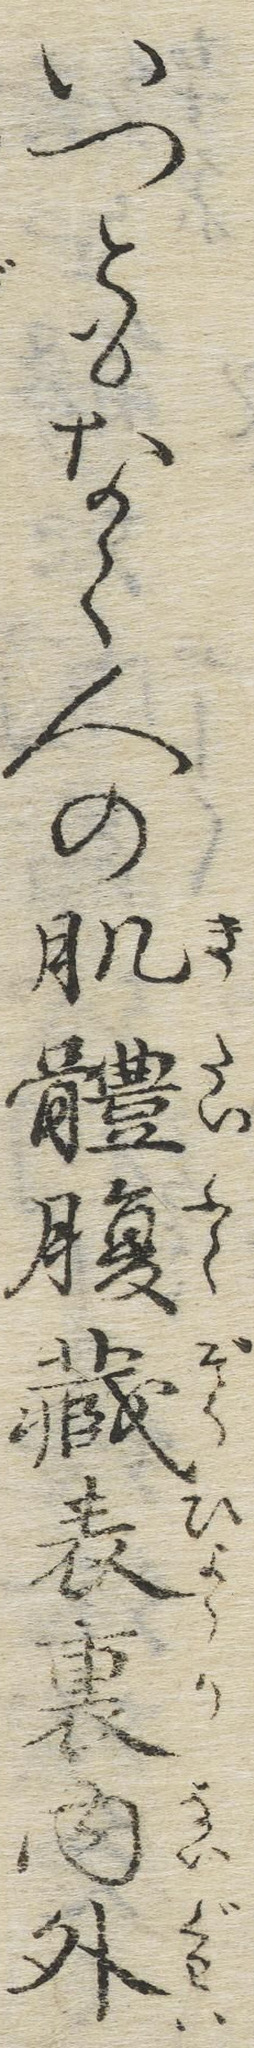いつともなく人の肌体腹蔵表裏内外
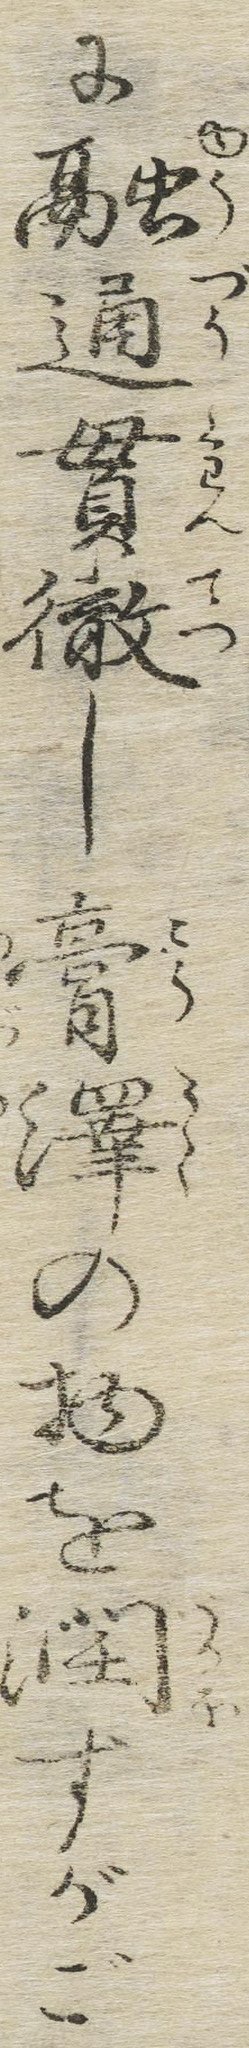に融通貫徹し膏沢の物を潤すがご
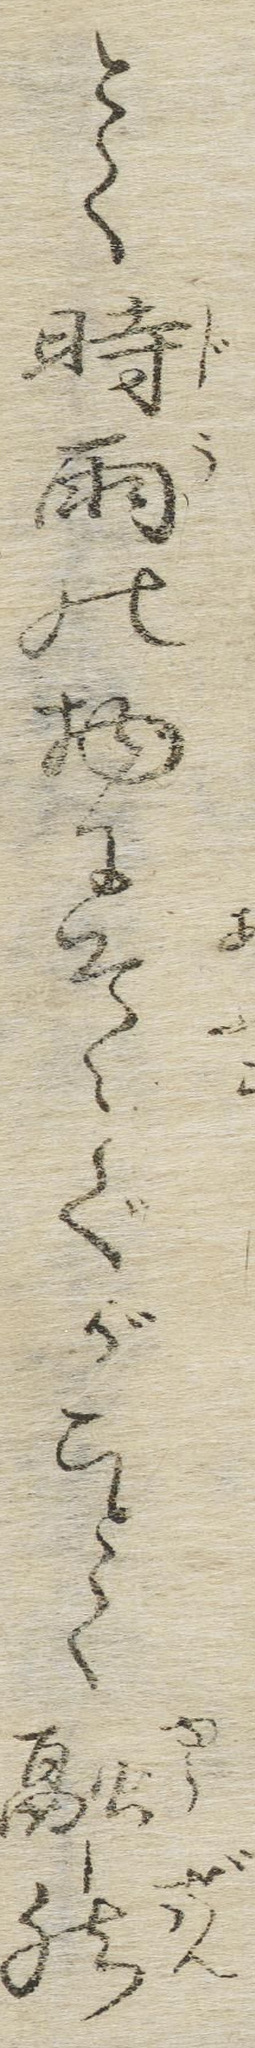とく時雨の物にそゝぐがことく融然

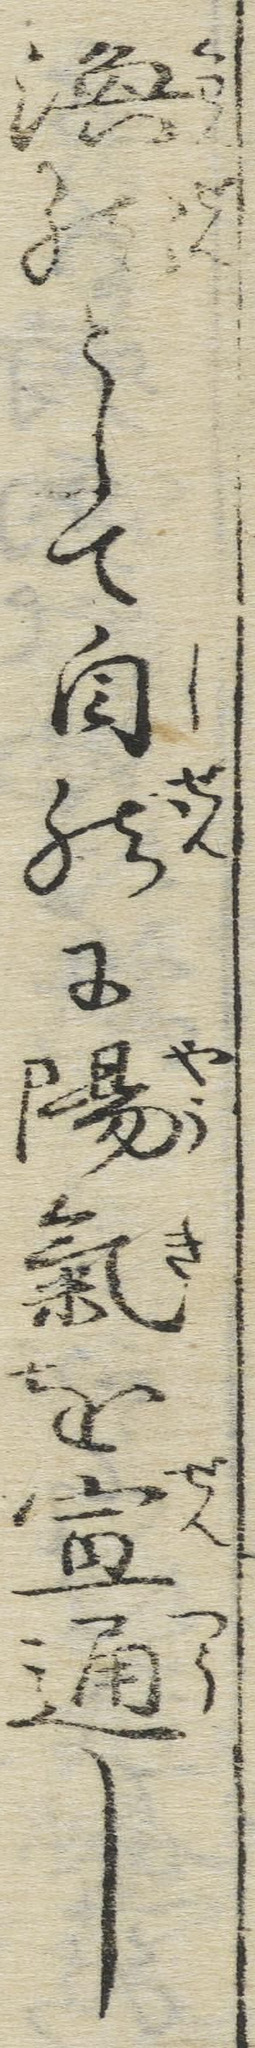渙然として自然に陽気を宣通し
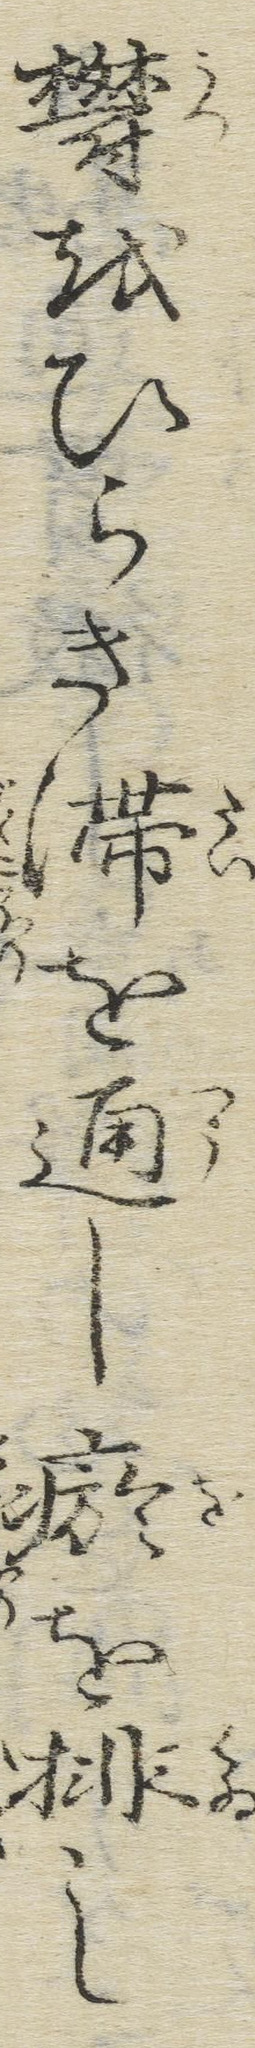欝をひらき滞を通し瘀を排し
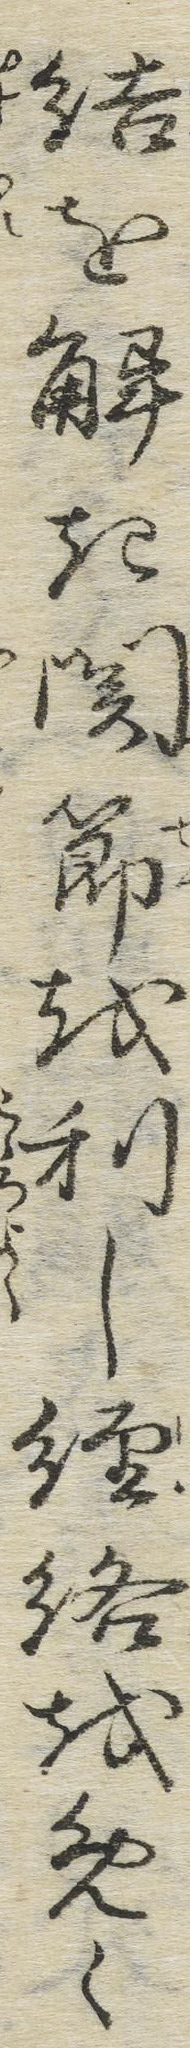結を解き関節を利し経絡をめく
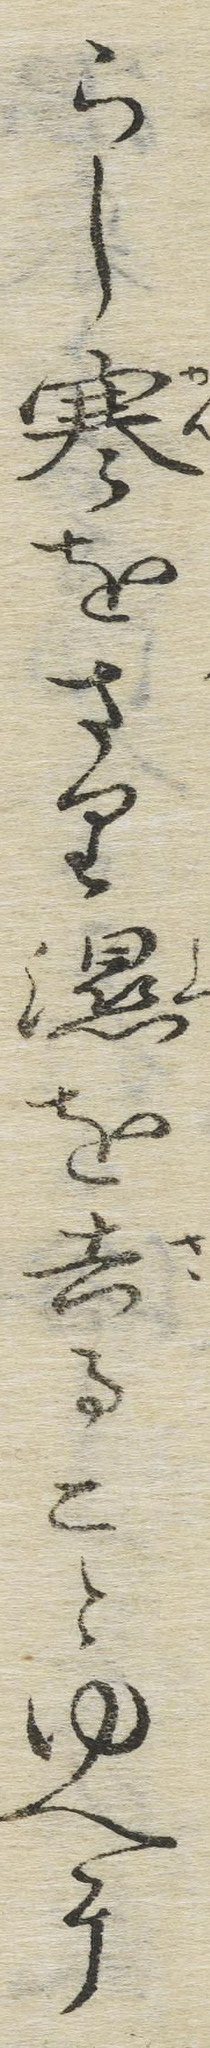らし寒をさり湿を去ることゆへに
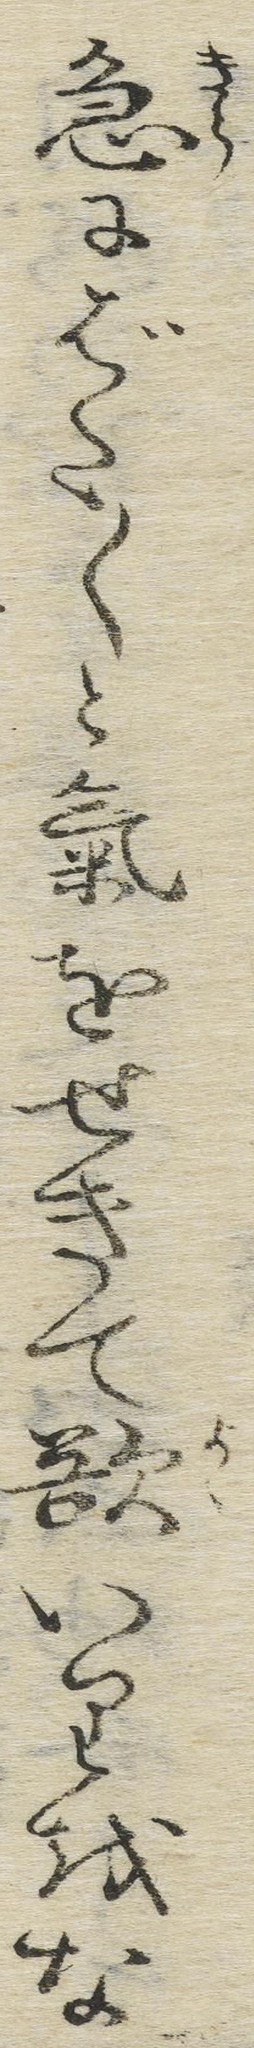急にばた〳〵と気をせきて欲いりをな
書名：温泉考
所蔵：東京大学地震研究所図書室 Earthquake Research Institute Library, The University of Tokyo, JAPAN
